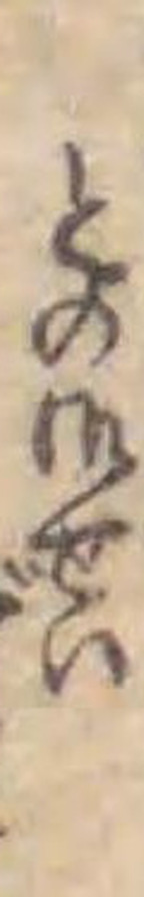との御せい

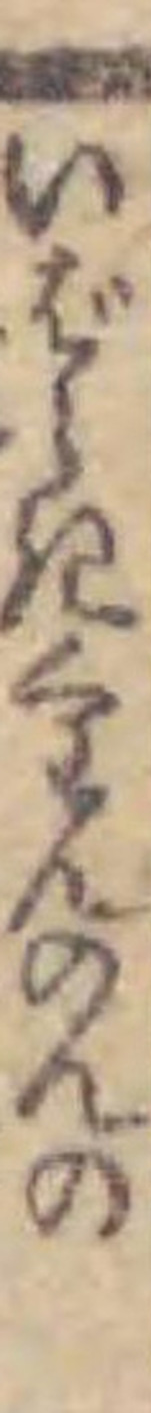いばらきくわんのんの
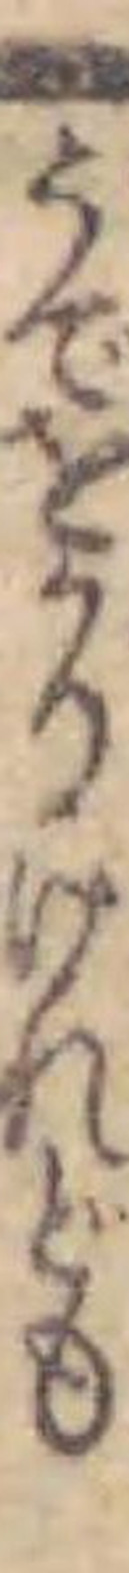うでをかりけれども
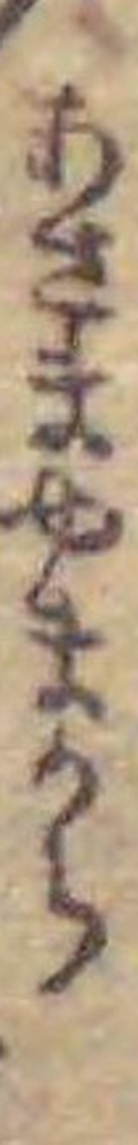あさまやまから
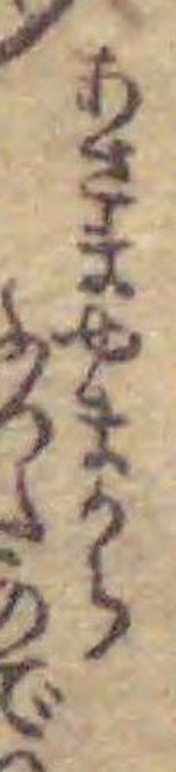あさまやまから
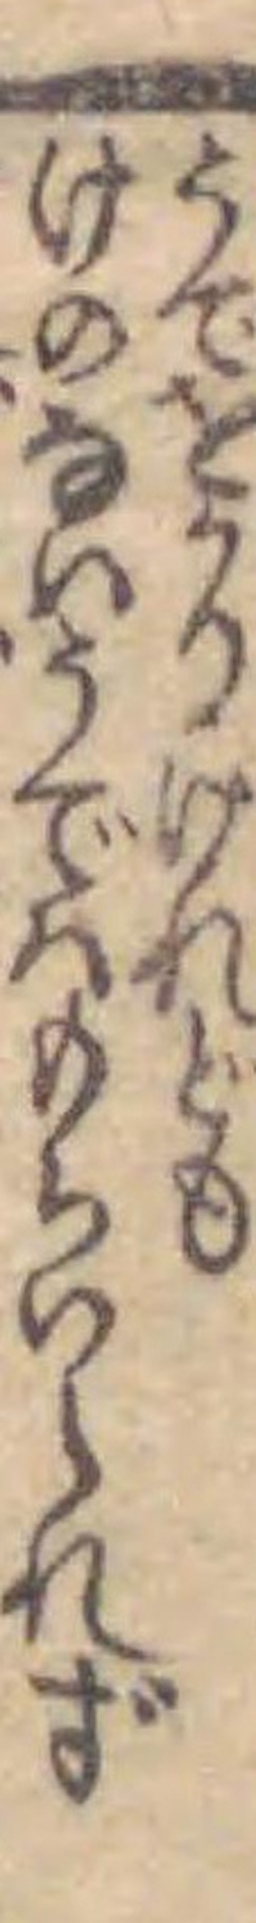けのないうではもちいられず
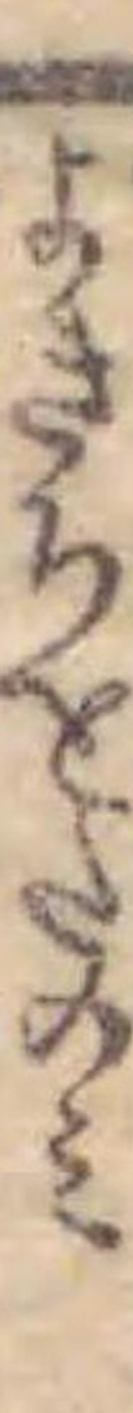よきちをたのみ
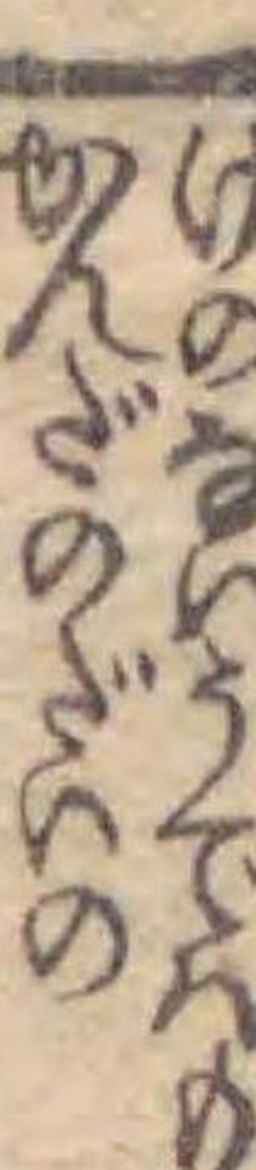かんだのだいの
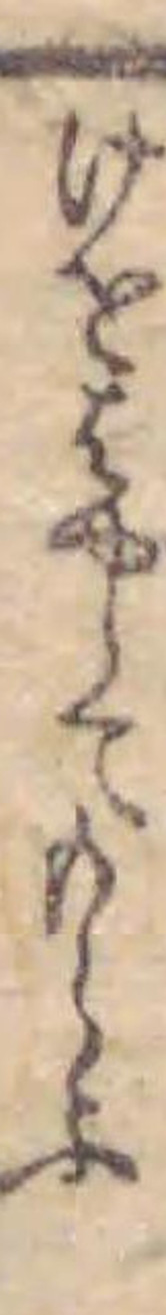けをはやしてもらふ
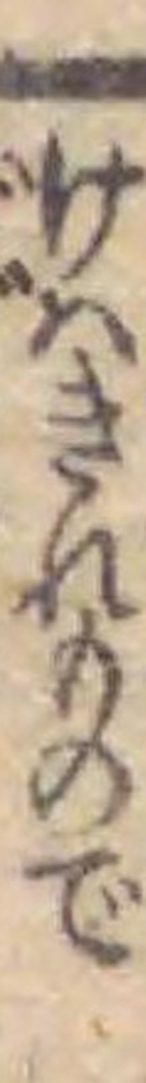けはきれもので
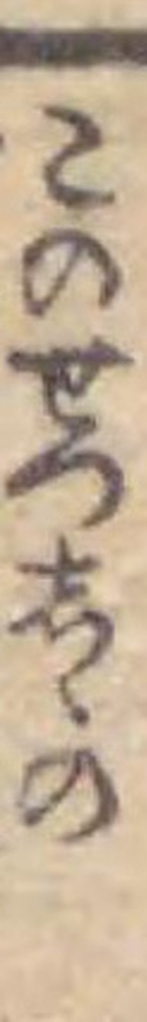このせつしゝの
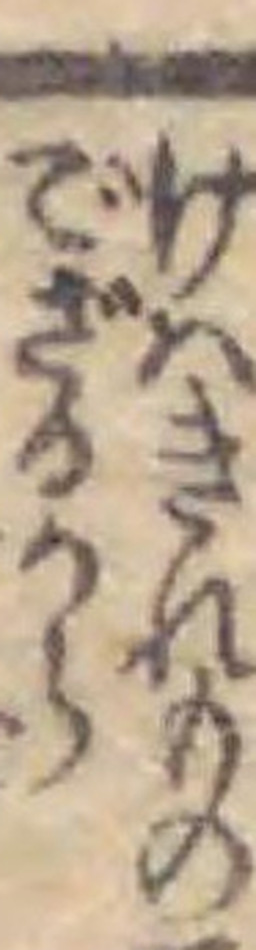ござるから
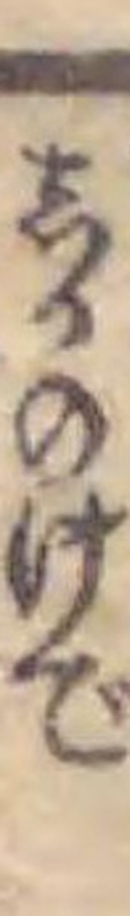しかのけで
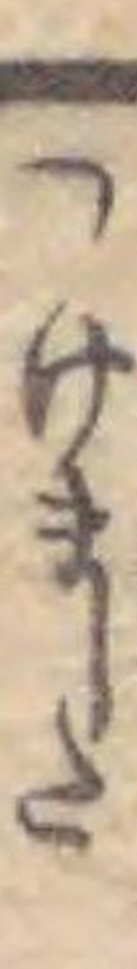つけました
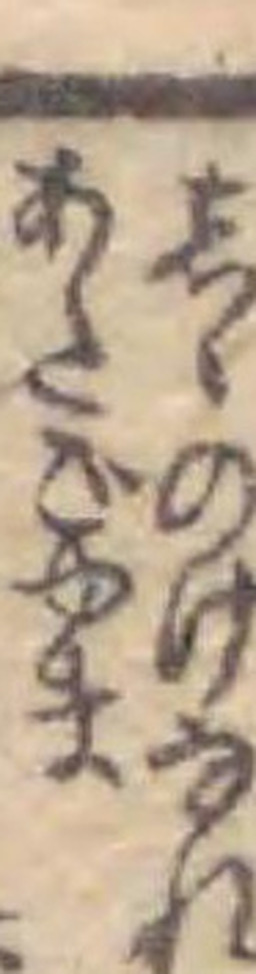あたごやま
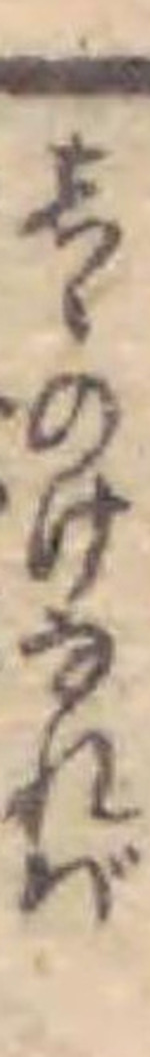しゝのけなれば
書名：大悲の千六本 : 1巻
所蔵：国立国会図書館 National Diet Library, JAPAN
